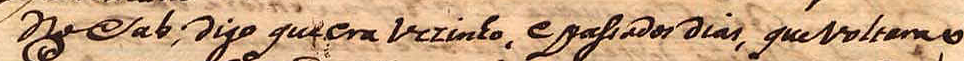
no sab; digo que era vezinho, e passados dias, que voltara o
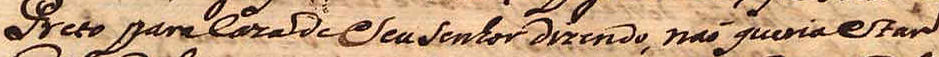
Preto para Caza de Seu senhor dizendo, naõ queria estar
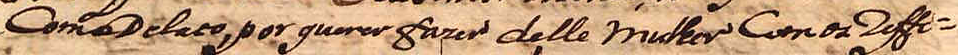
Com o Delato, por querer fazer delle mulher Com os Reffe
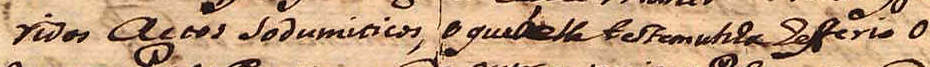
ridos Actos sodumiticos, o que delle testemunha Refferio o
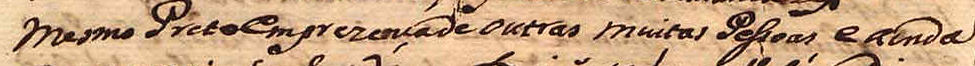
mesmo Preto Em prezença de outras muitas Pessoas e ainda
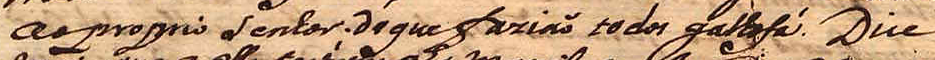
ao proprio Senhor; de que faziaõ todos galhofa. Dice
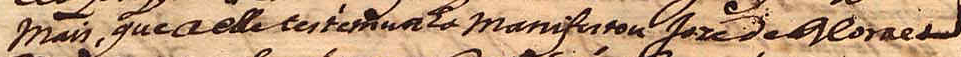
mais, que a elle testemunha manifestou Joze de Moraes
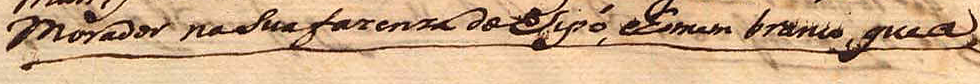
Morador na sua fazenza do Sipó, e homen branco, que a
